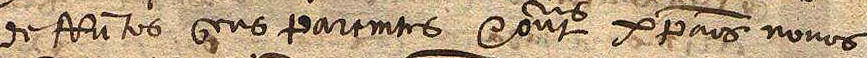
deffūtos seus Paremtes e outros xpãos nouos
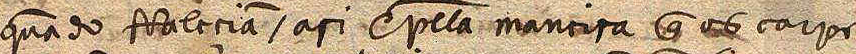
qūado ffaleciā / asi e p̄lla maneira q̄ os carpē
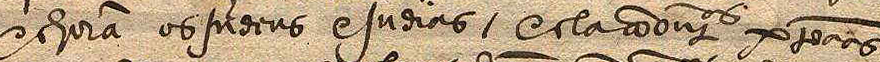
e chorā os Judeus e Judias / e ela c̄o outras xpāas
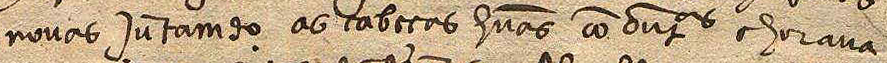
nouas Jūtamdo as cabeças hūas c̄o outras choraua
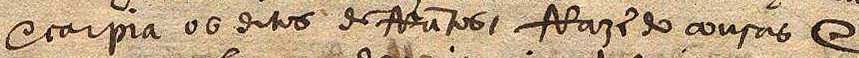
e carpia os ditos deffūtos / ffazēdo cousas e
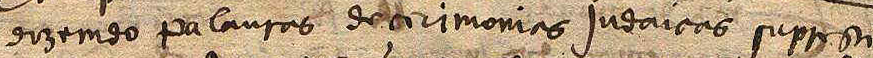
dizemdo palauras de cerimonias Judaicas supresti
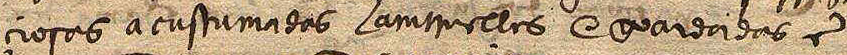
ciosas acustumadas amtre elles e goardadas ē
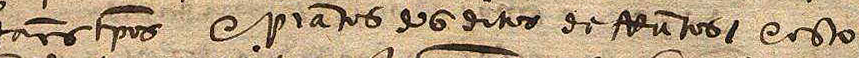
taēs tp̄os e prātos dos ditos deffūtos / e esto
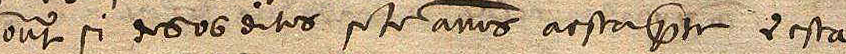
outro si des os ditos sete ānos a esta p̄te ē esta
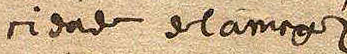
cidade de lamego /
